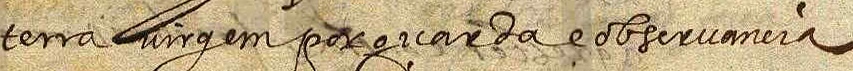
terra virgem por guarda e observancia
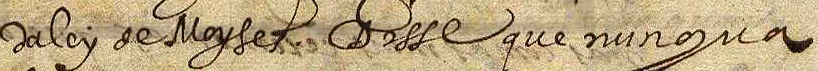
da ley de Moyses. Disse que nunqua
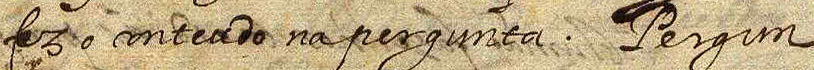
fez o conteudo na pergunta. Pergun
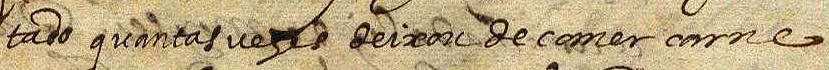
tado quantas vezes deixou de comer carne
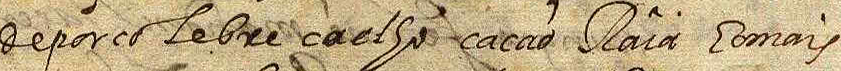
de porco lebre coelho caçaõ Raia e o mais
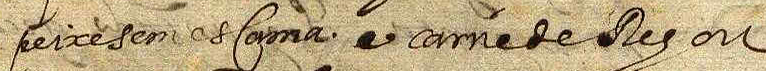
peixe sem escama e carne de Res ou
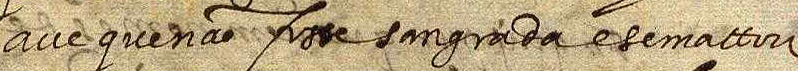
ave que não fosse sangrada e se mattou
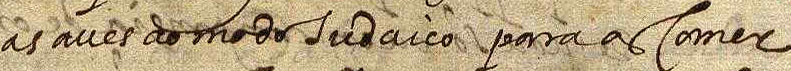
as aves do modo Judaico para as Comer
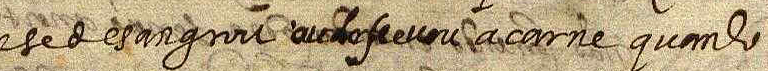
e se desangrou ou defrevou a carne quando
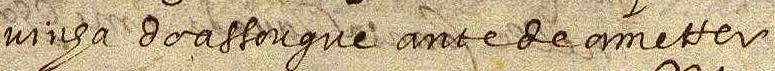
vinha do assougue ante de a metter
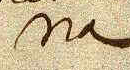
na
